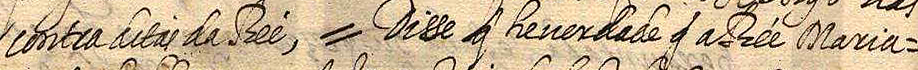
contraditas da Reé, = Disse q̄ he uerdade q̄ a Rée Maria
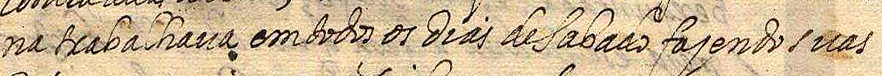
na trabalhaua em todos os dias de sabado fazendo suas
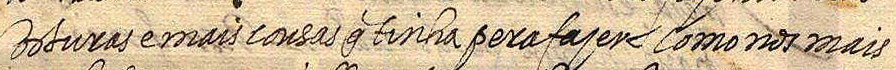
Costuras e mais cousas q̄ tinha pera fazer como nos mais
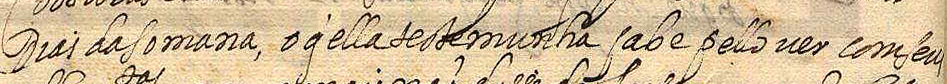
dias da somana, o q̄ ella testemunha sabe pello uer com seus
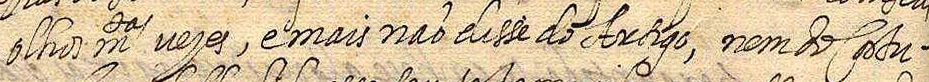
olhos mtas uezes, e mais naõ disse do Artigo, nem do Costu
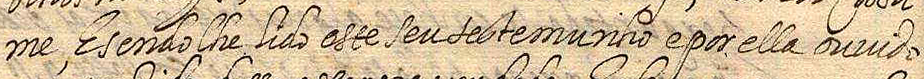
me, E sendolhe lido este seu testemunho e por ella ouuido
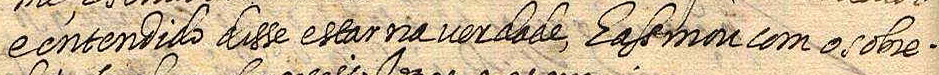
e entendido disse estar na uerdade, E assinou com o sobre
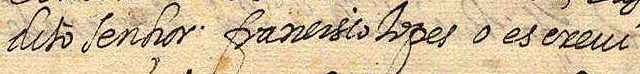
dito Senhor francisco lopes o escreui
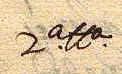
2a. tta.
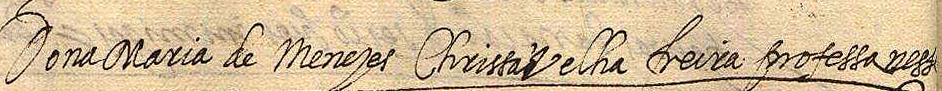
Dona Maria de Menezes Christā Velha freira professa nest
